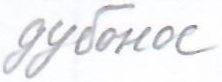дубонос
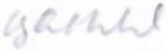цапля
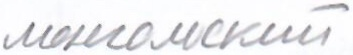монгольский
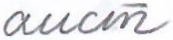аист
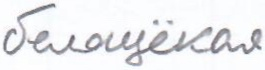белощёкая
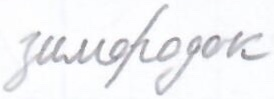зимородок
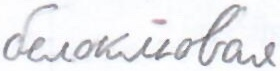белоклювая
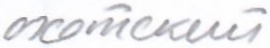охотский
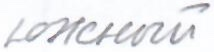южный
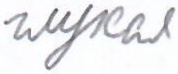глухая
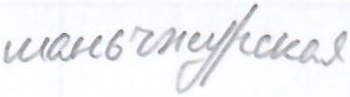маньчжурская
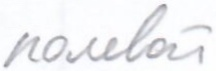полевой
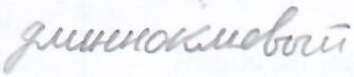длинноклювый
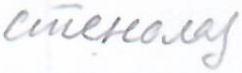стенолаз
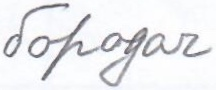бородач
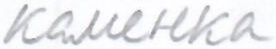каменка
